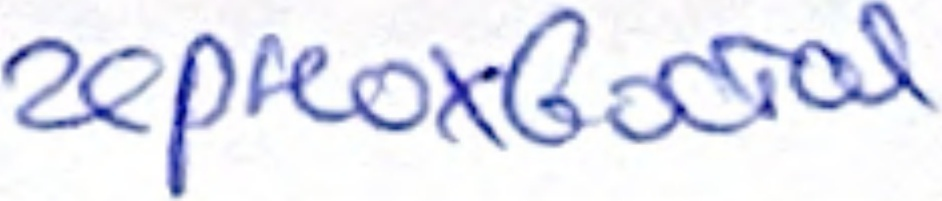чернохвостая
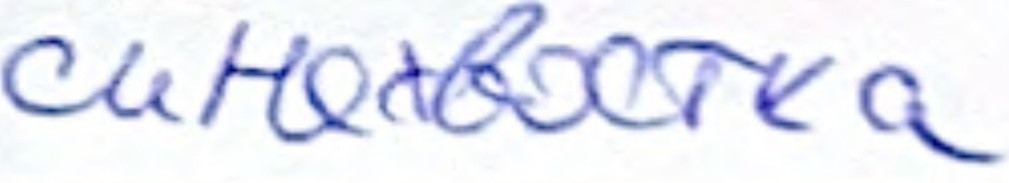синехвостка
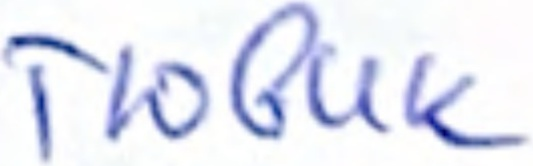тювик
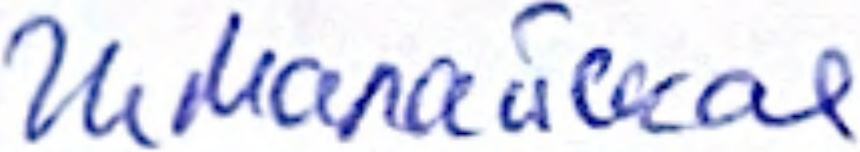гималайская
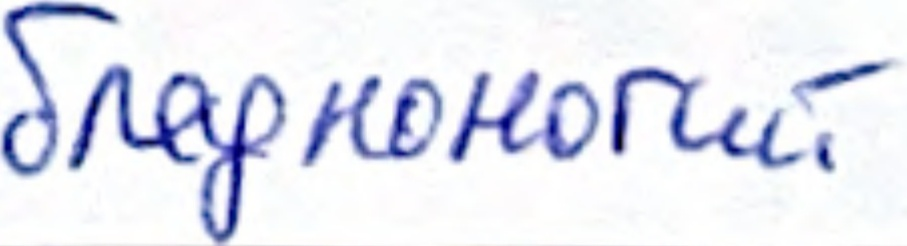бледноногий
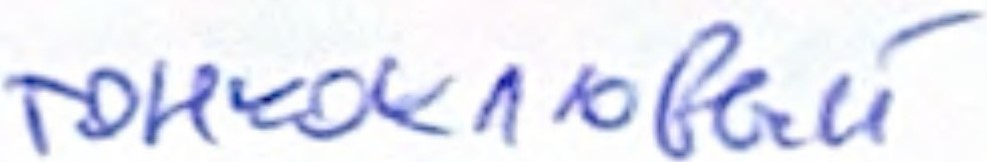тонкоклювый
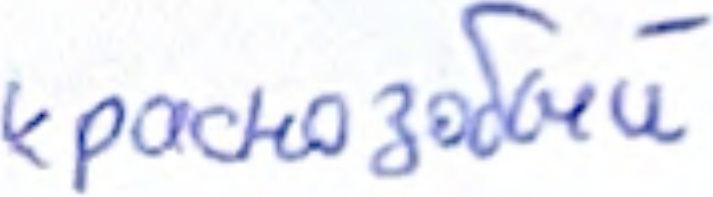краснозобый
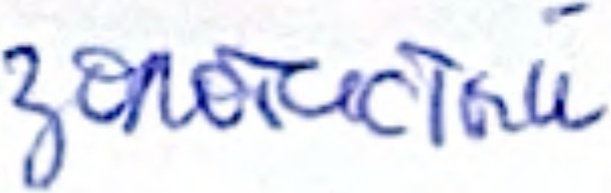золотистый
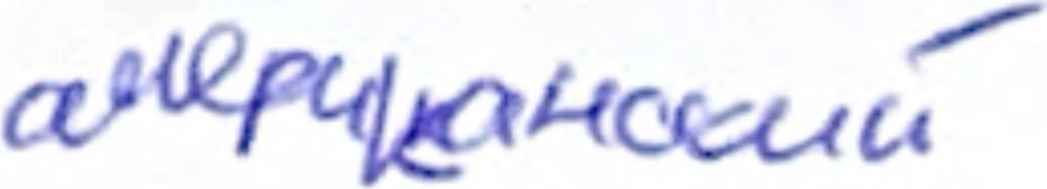американский
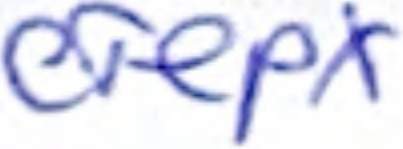стерх
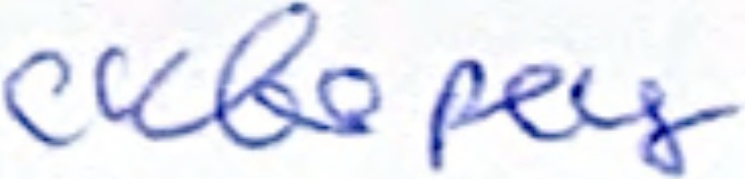скворец
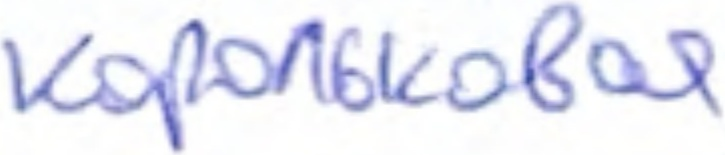корольковая
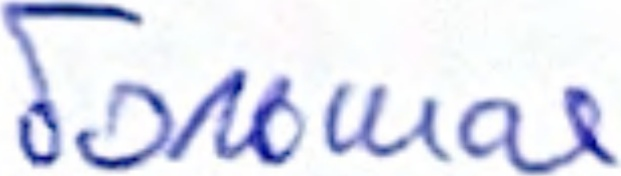большая
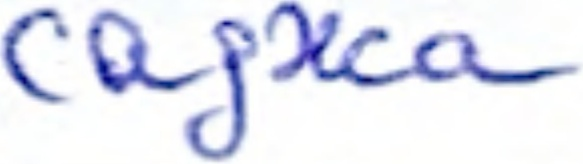саджа
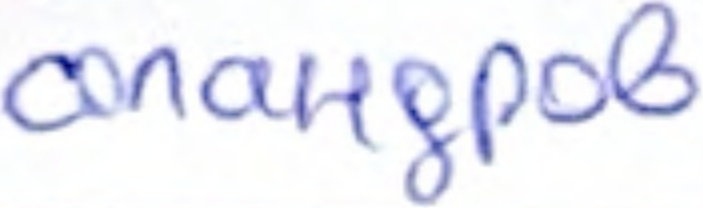соландров
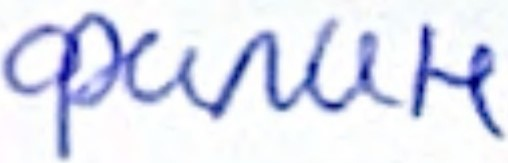филин
